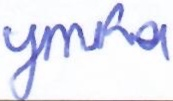утка
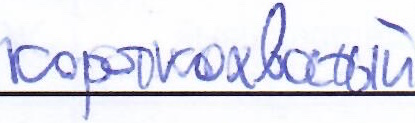короткохвостый
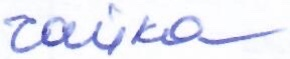чайка
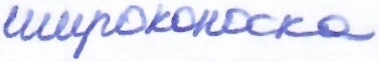широконоска
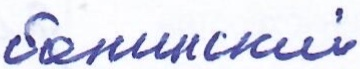бонинский
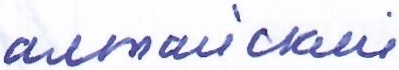алтайский
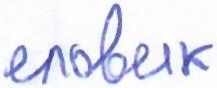еловик
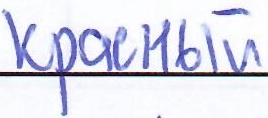красный
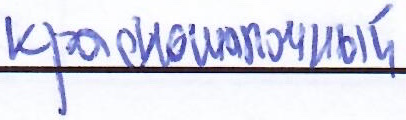красношапочный
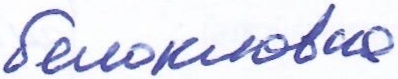белоклювая
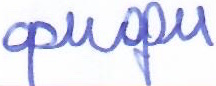фифи
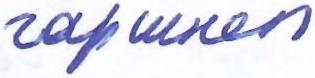гаршнеп
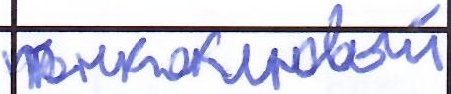тонкоклювый
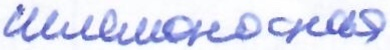шлемоносная
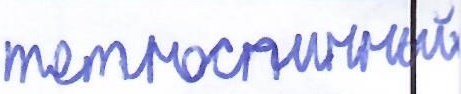тетноспинный
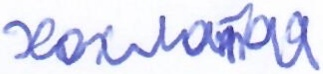хохлатая
